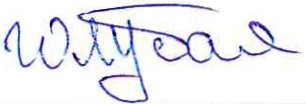голубая
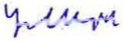улит
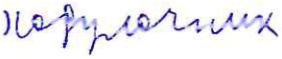ходулочник
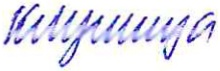клушица
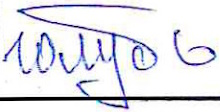голубь
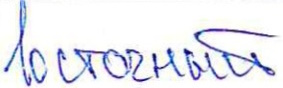восточный
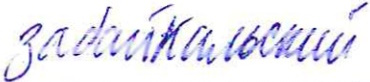забайкальский
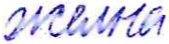желна
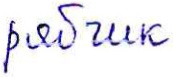рябчик
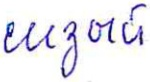сизый
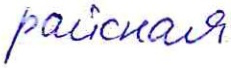райская
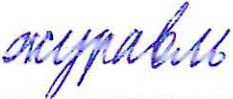журавль
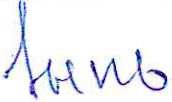выпь
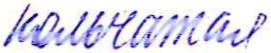кольчатая
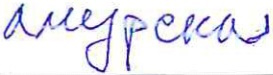амурская
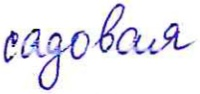садовая
